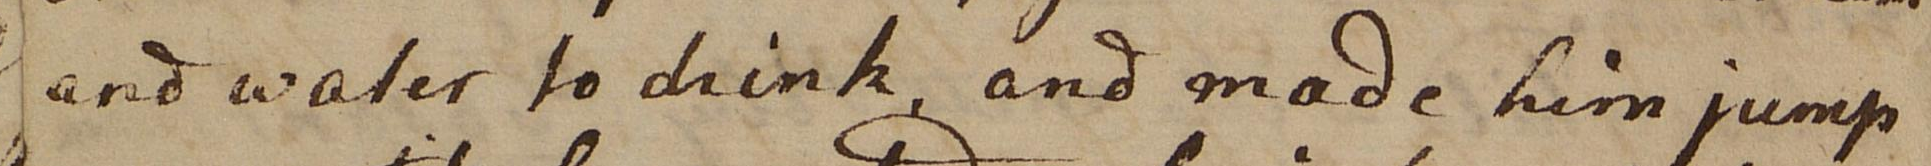and water to drink, and made him jump
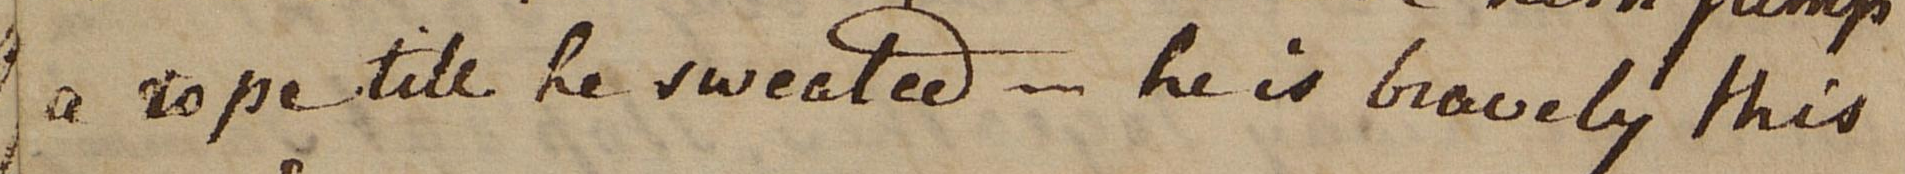a rope till he sweated- he is bravely this
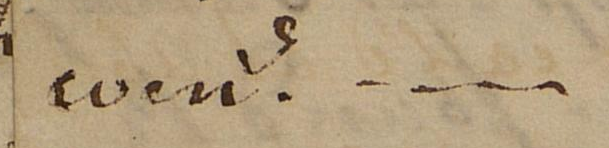Even^g.--
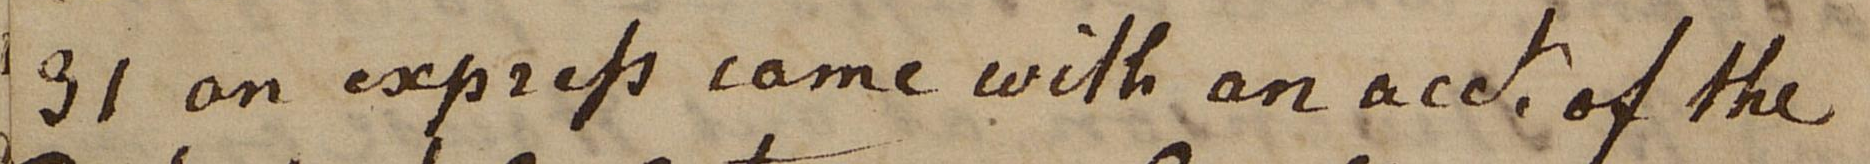31 an express came with an acc^t. of the
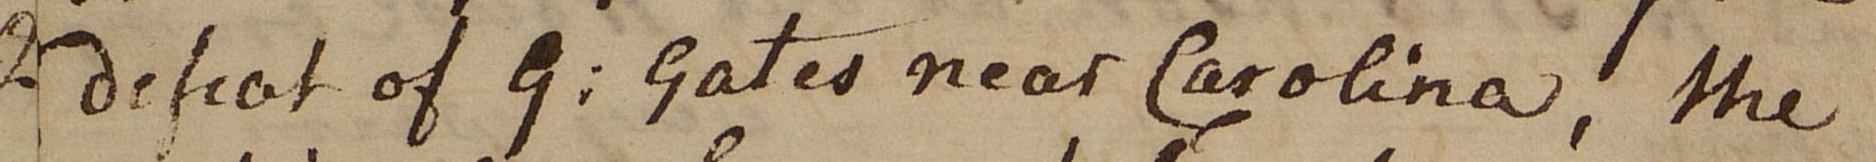defeat of G: Gates near Carolina, the
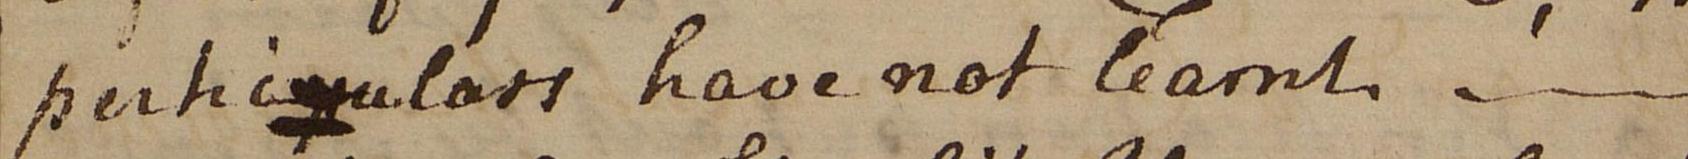pertic[_]ulars have not learnt.-
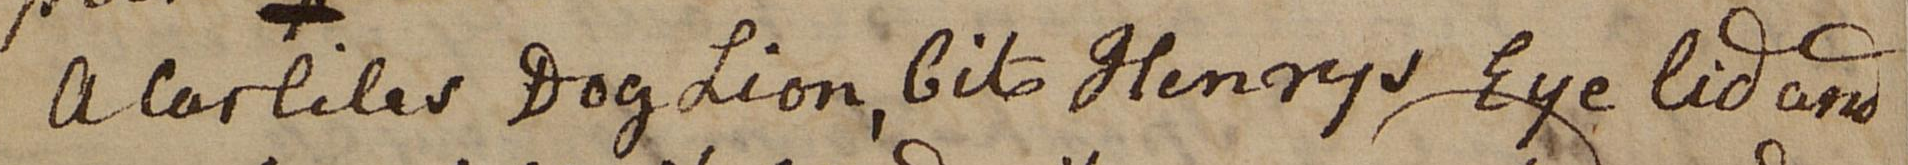a Carliles Dog Lion, bit Henrys Eye lid and
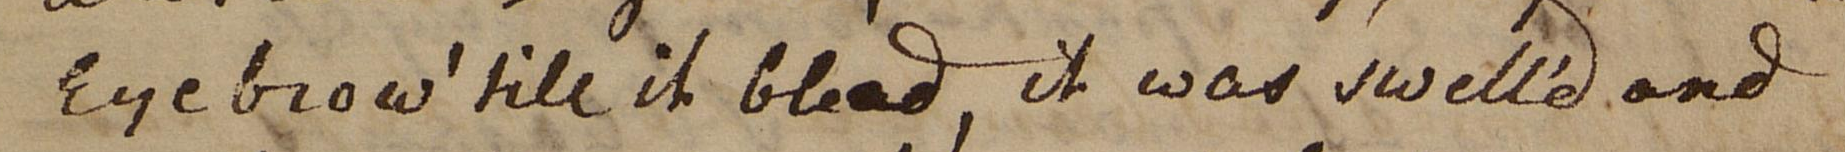Eyebrow 'till it blead, it was swell'd and
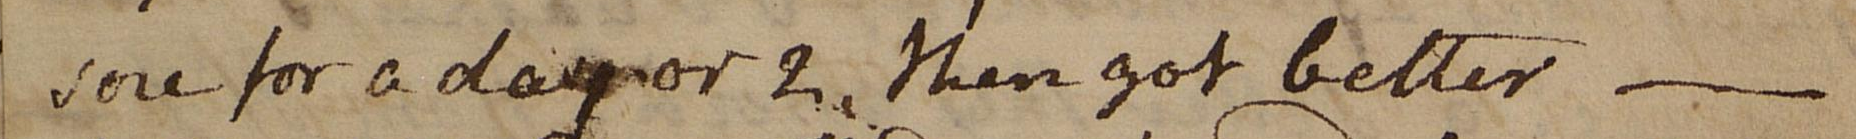sore for a day or 2, then got better-
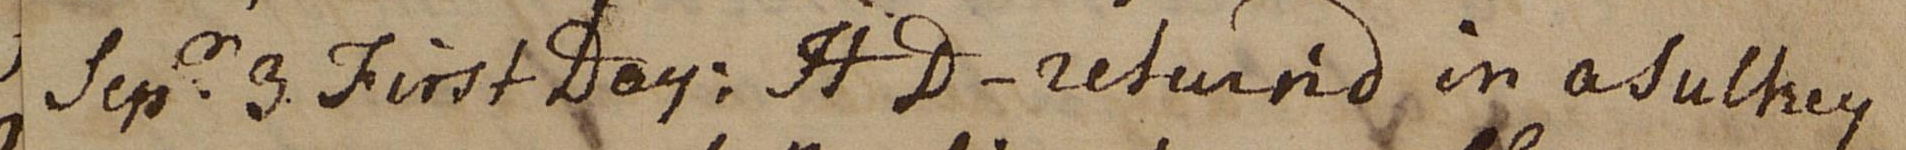Sep^r e. First Day: HD- return'd in a Sulkey
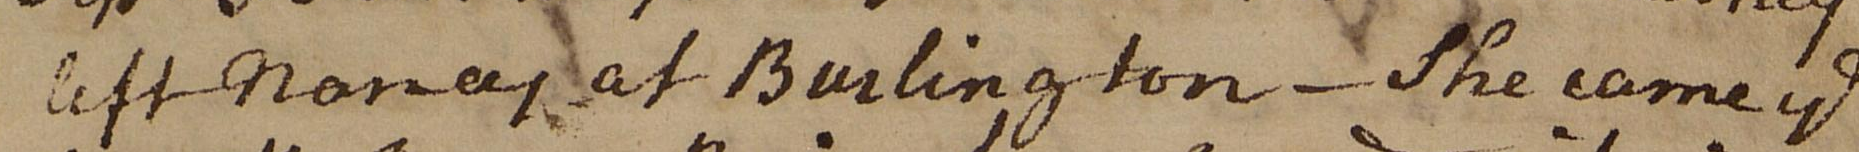left Nancy at Burlington- She came y^e
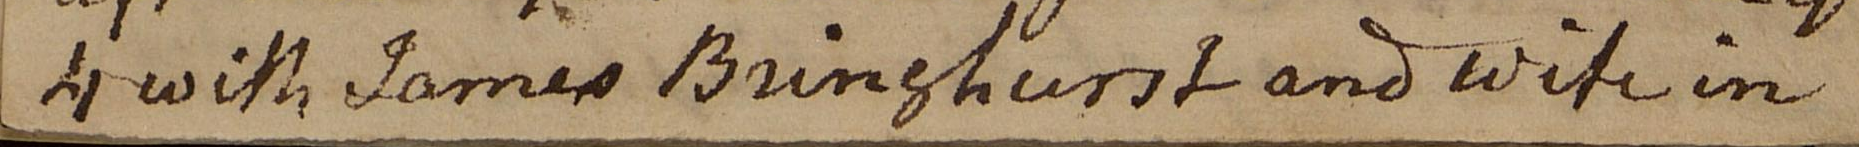4 with James Bringhurst and wife in
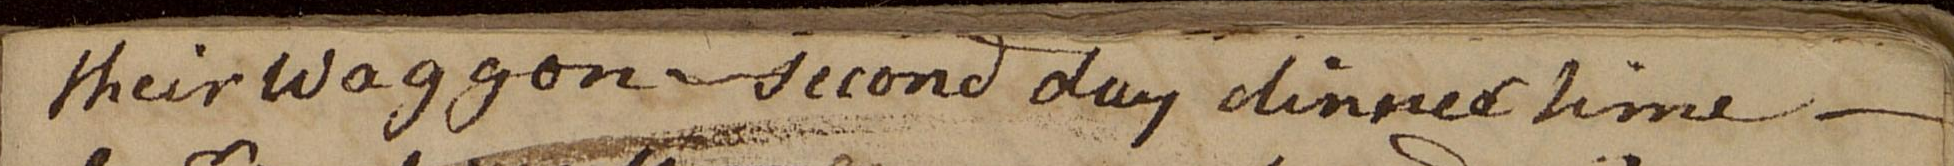their Waggon- second day dinner time-
